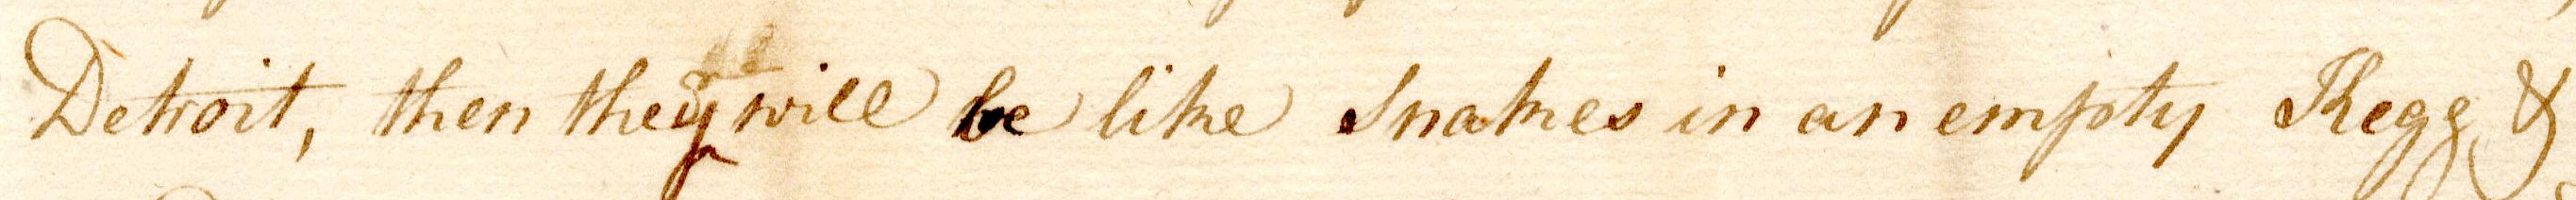Detroit, then they will be like snakes in an empty Kegg &
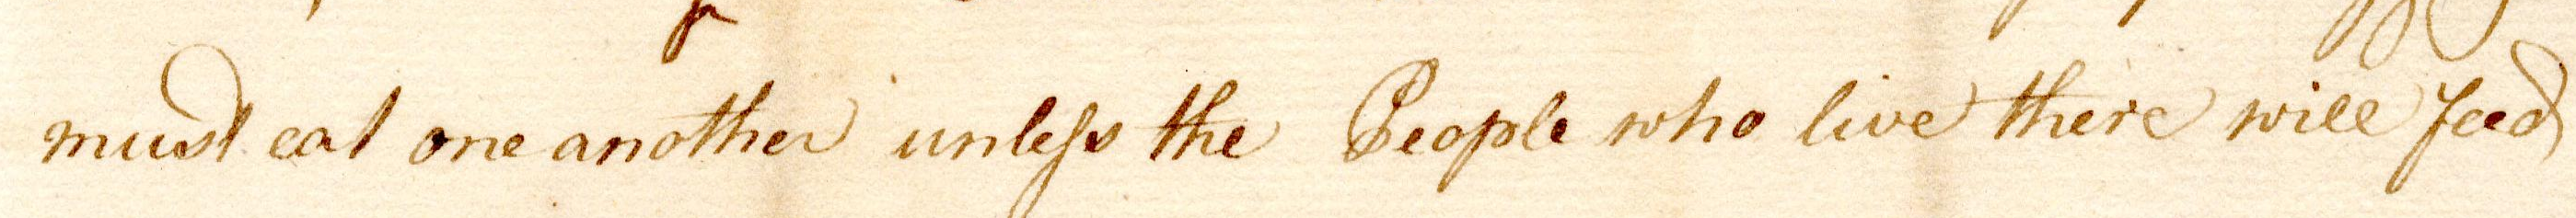must eat one another unless the People who live there will feed
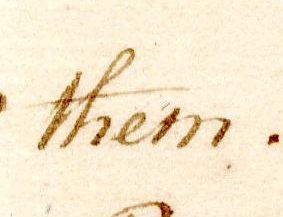them.
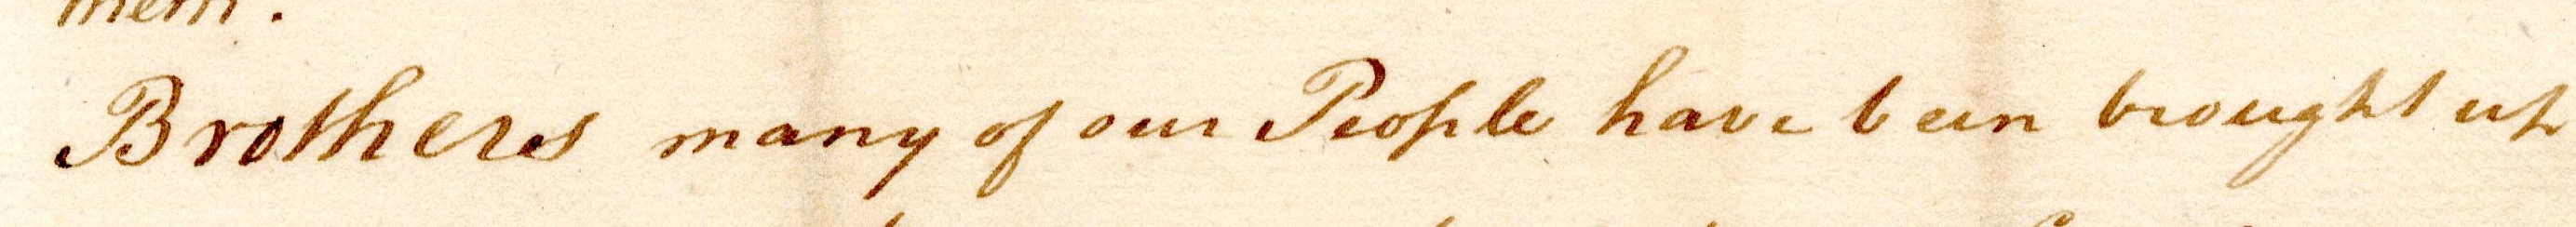Brothers many of our People have been brought up
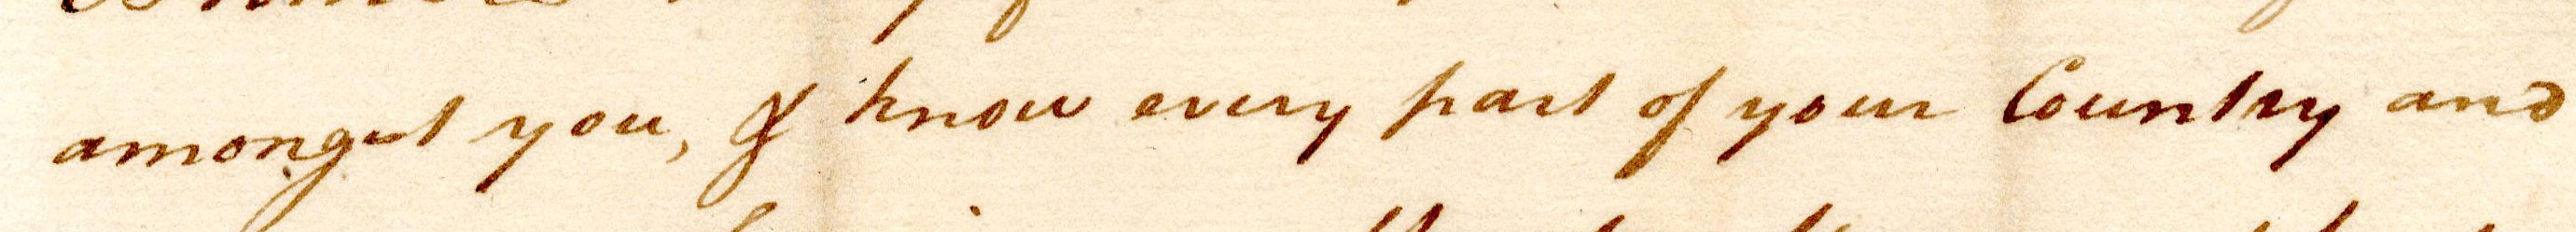amongst you, I know every part of your Country and
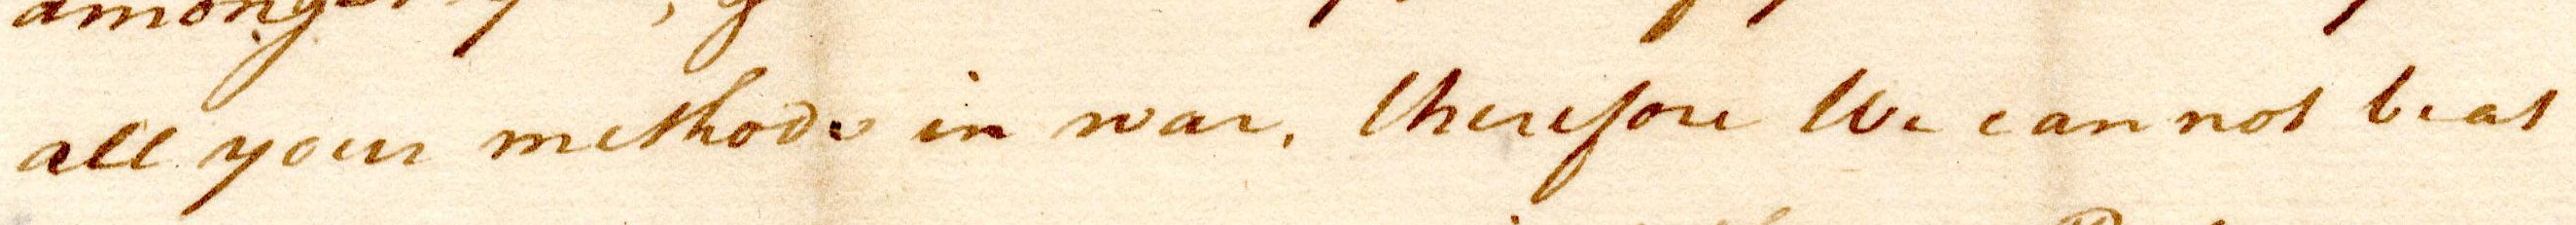all your methods in war, therefore We cannot beat
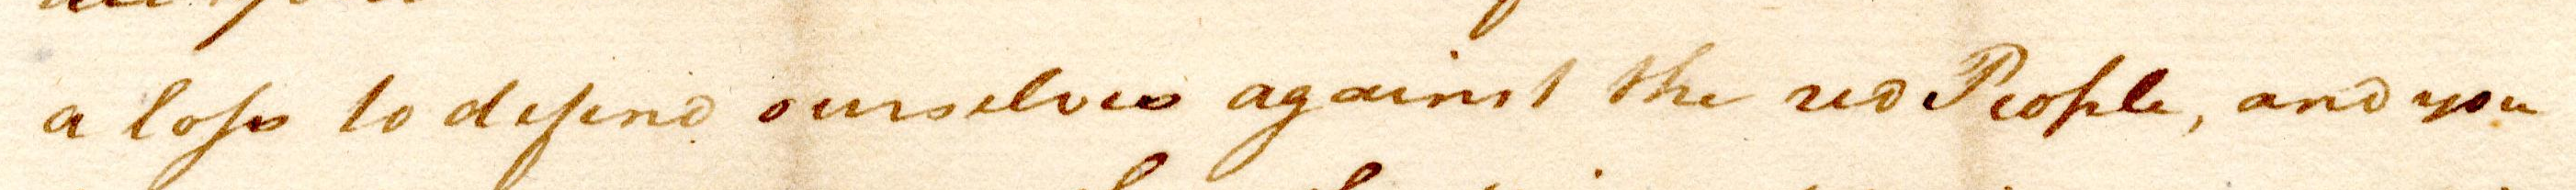a loss to defend ourselves against the red People, and you
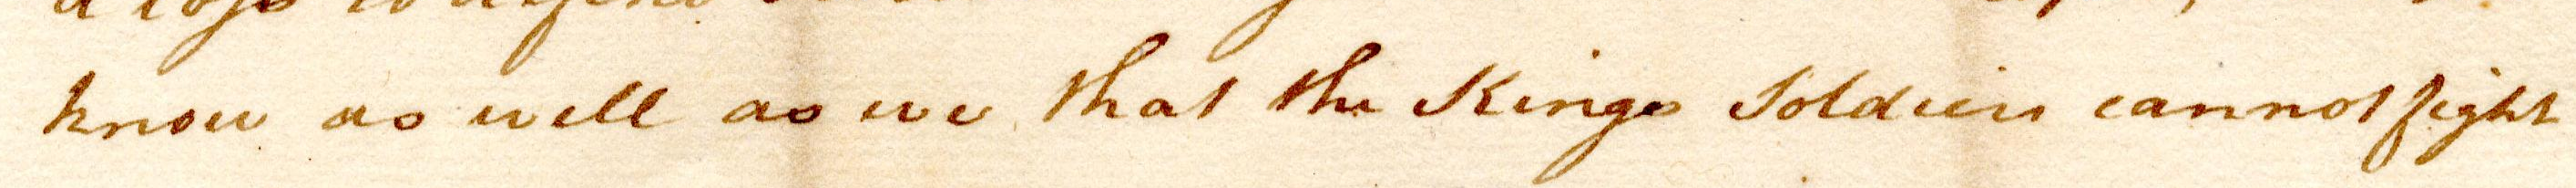know as well as we that the Kings Soldiers cannot fight
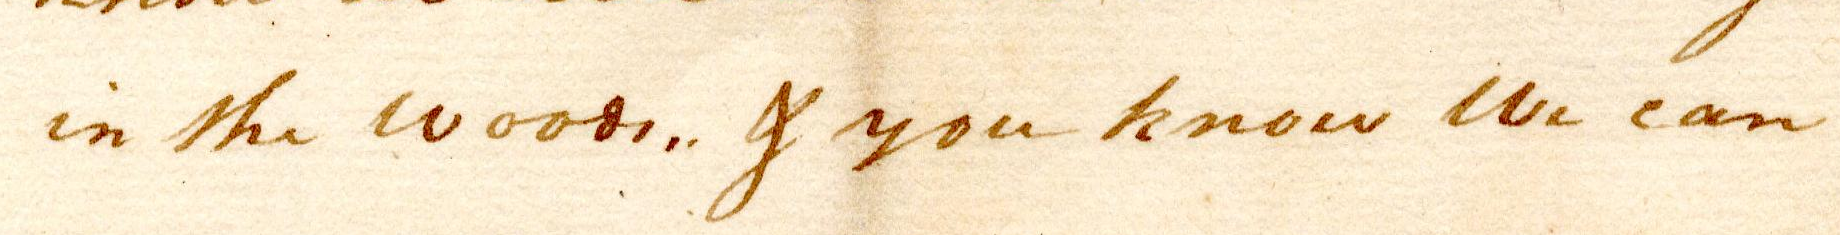in the woods, & you know we can
